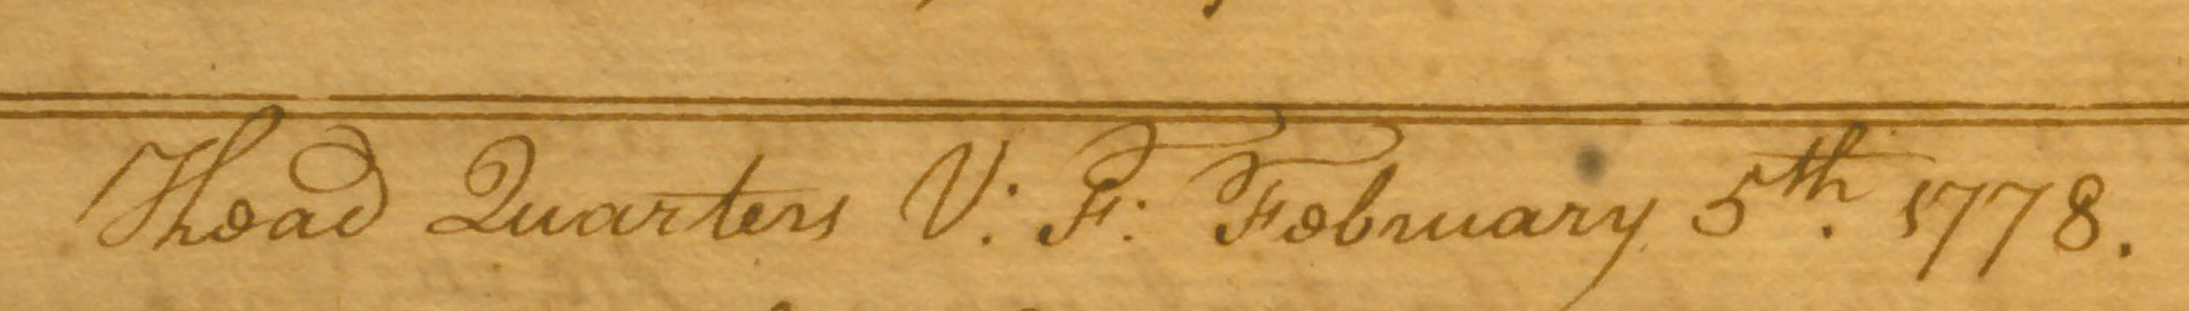Head Quarters V: F: February 5^th. 1778.
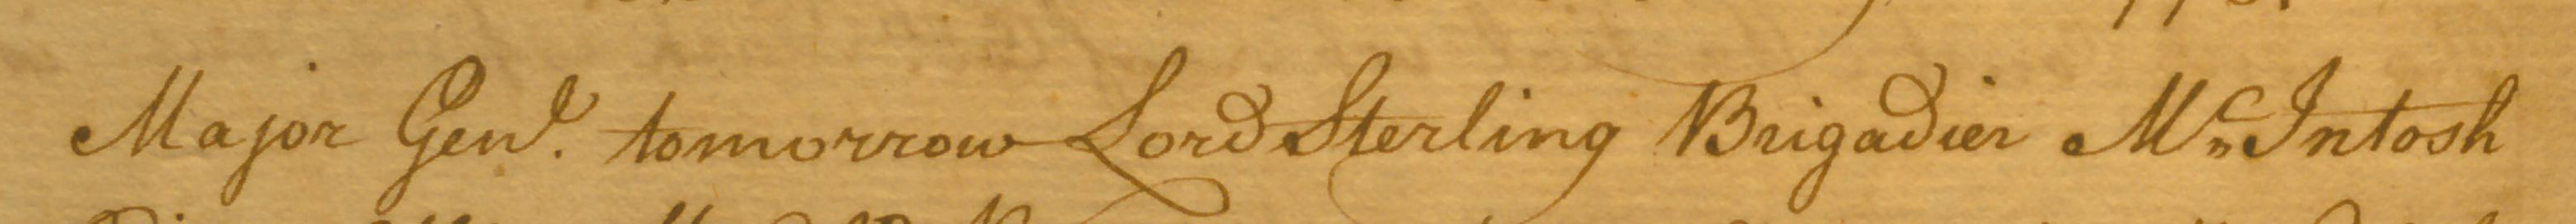Major Gen^l. tomorrow Lord Sterling Brigadier M^c.Intosh
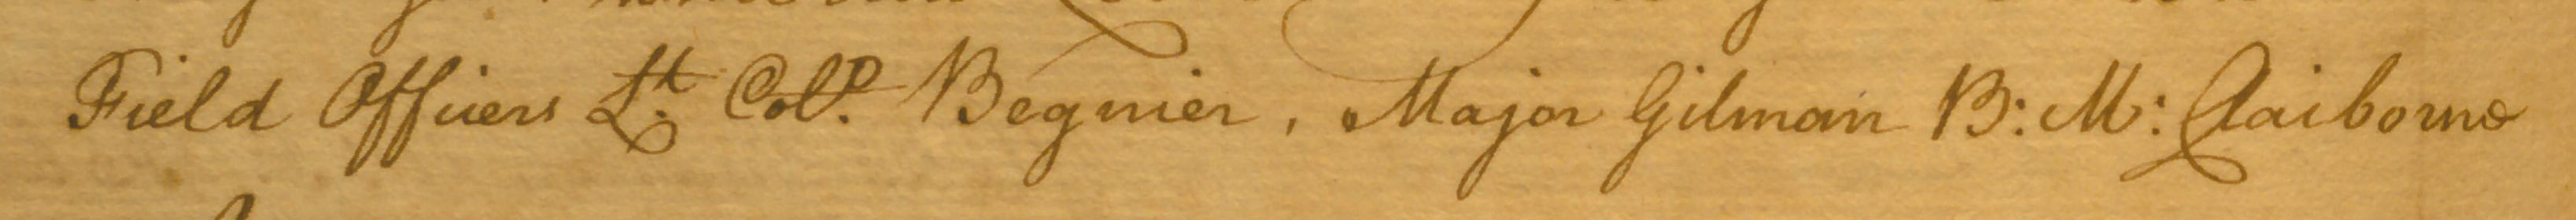Field Officers L^t. Col^o. Begnier, Major Gilman B: M: Claibourne
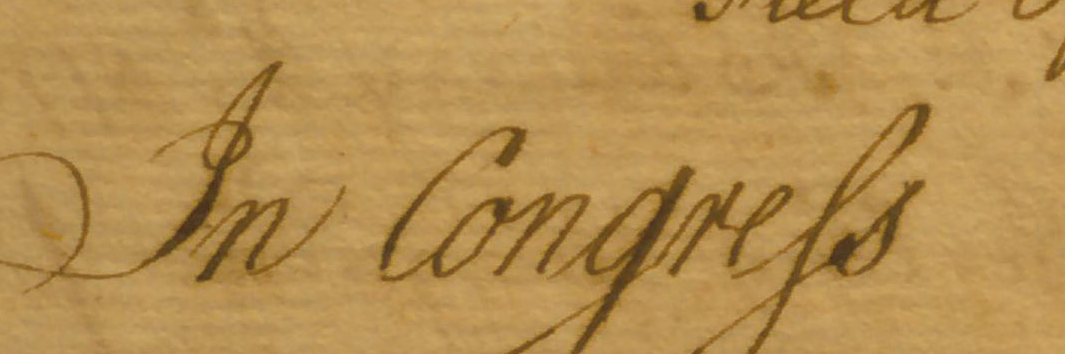In Congress
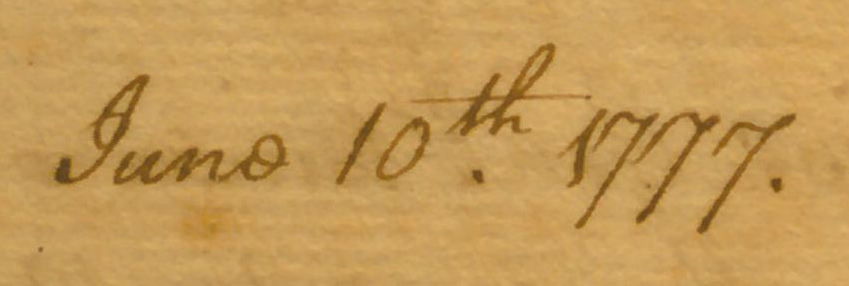June 10^th. 1777.
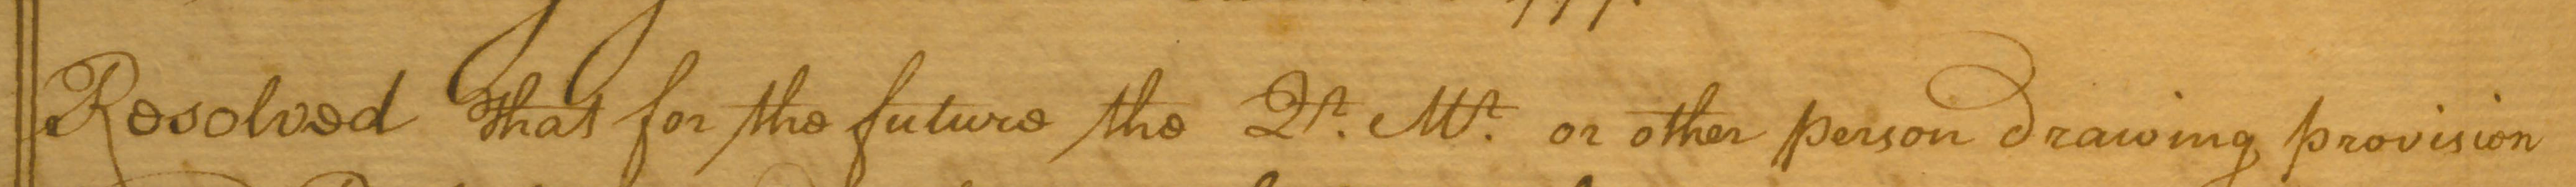Resolved That for the future the Q^r. M^r. or other person drawing provision
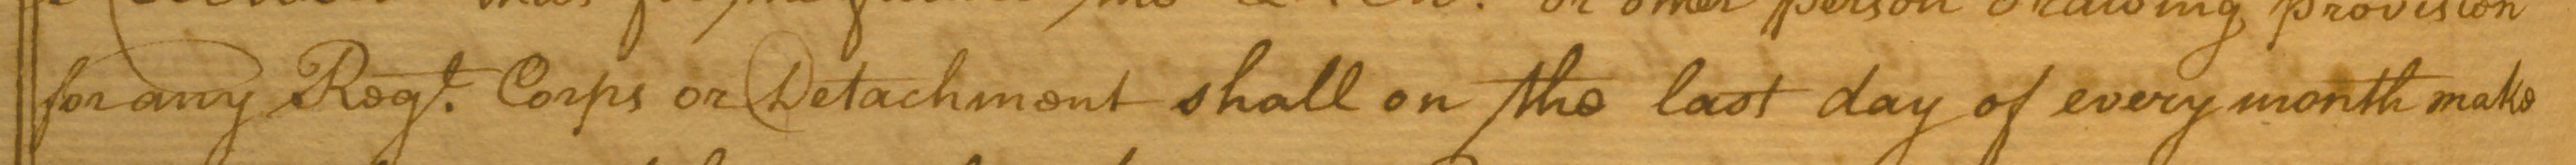for any Reg^t. Corps or Detachment shall on the last day of every month make
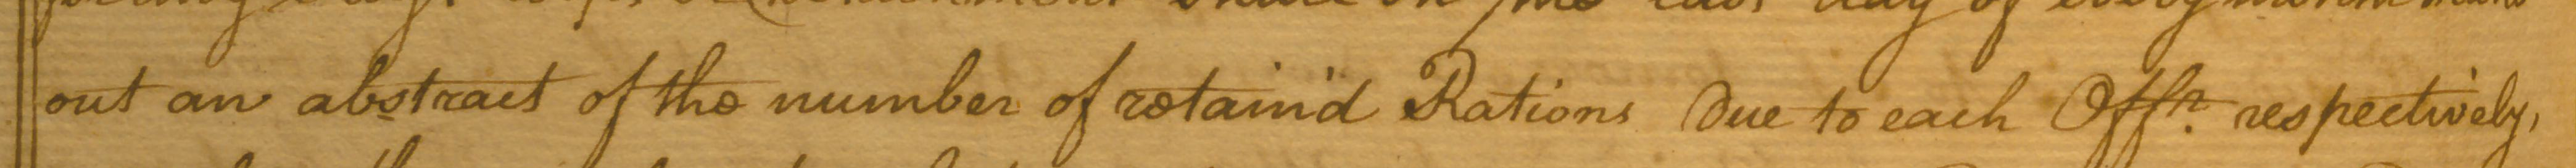out an abstract of the numbers of retain'd Rations due to each Off^r. respectively,
